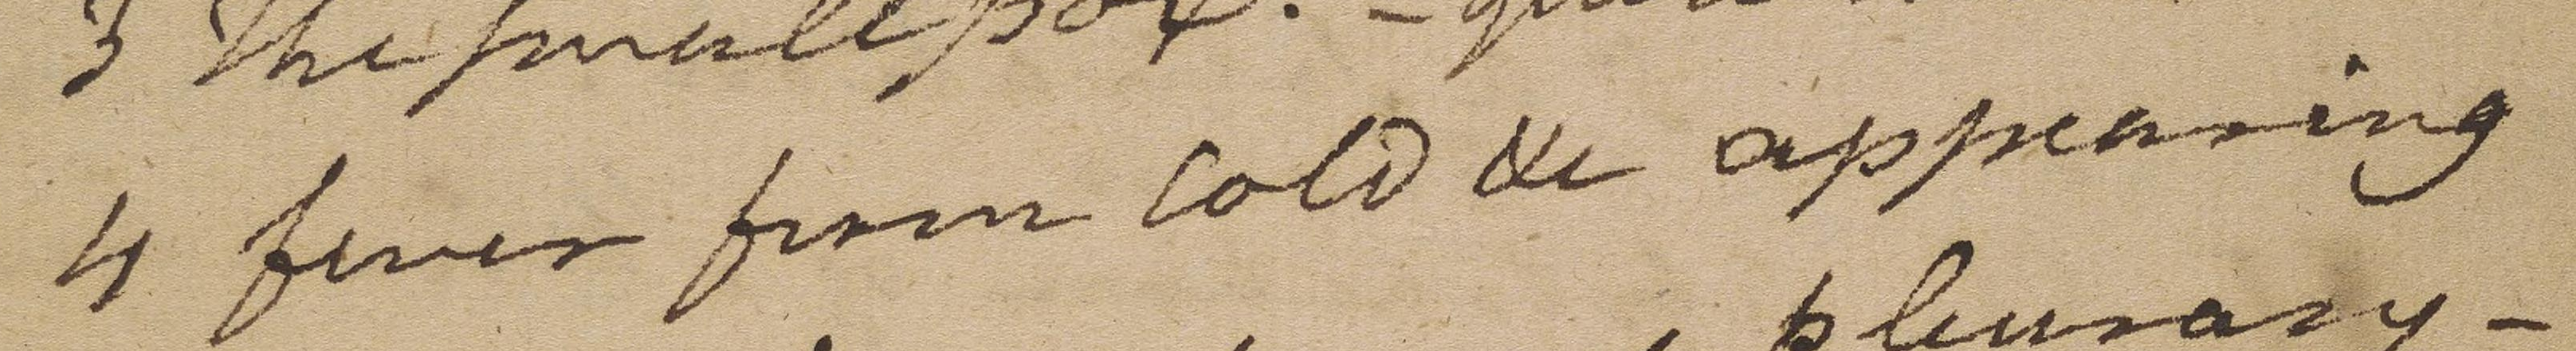4 fever from cold & appearing
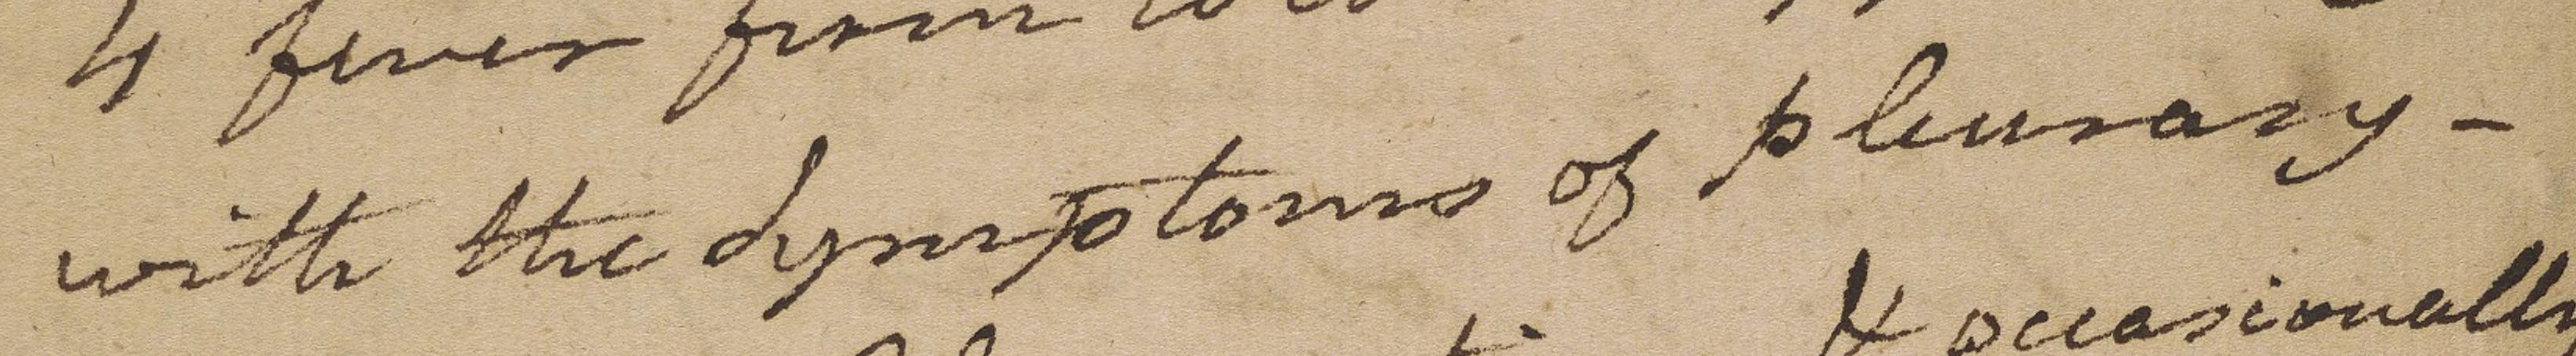with the Symptoms of pleurasy,
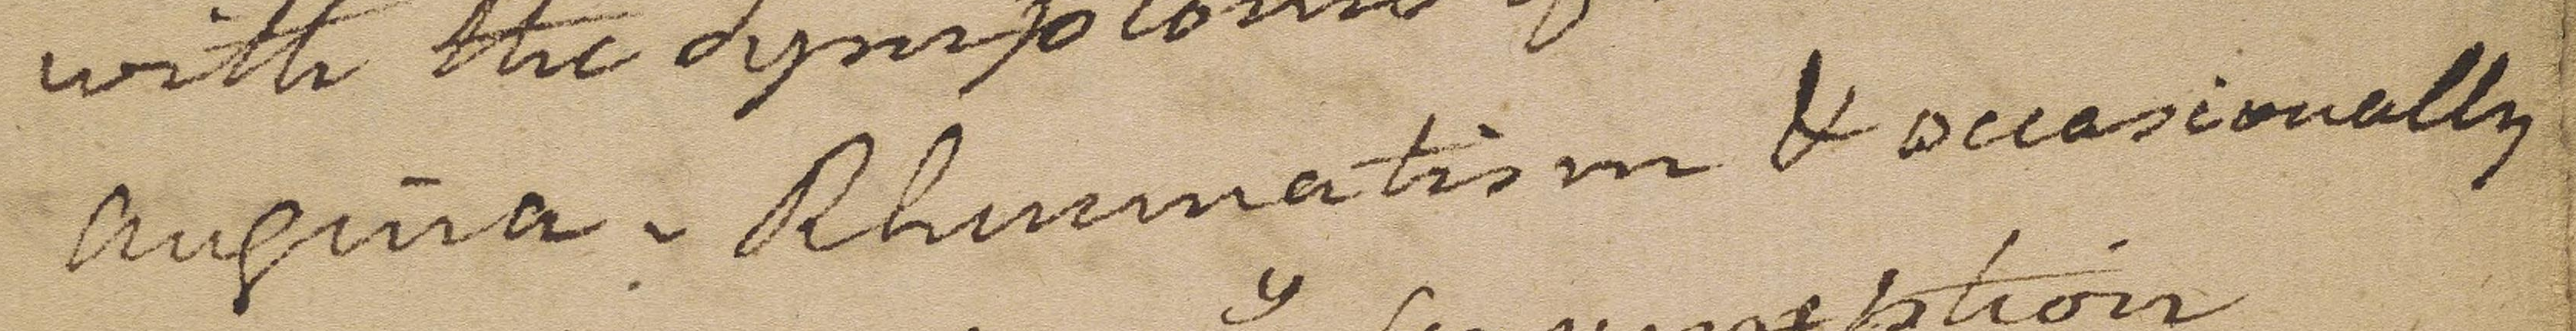angina, Rheumatism & occasionally
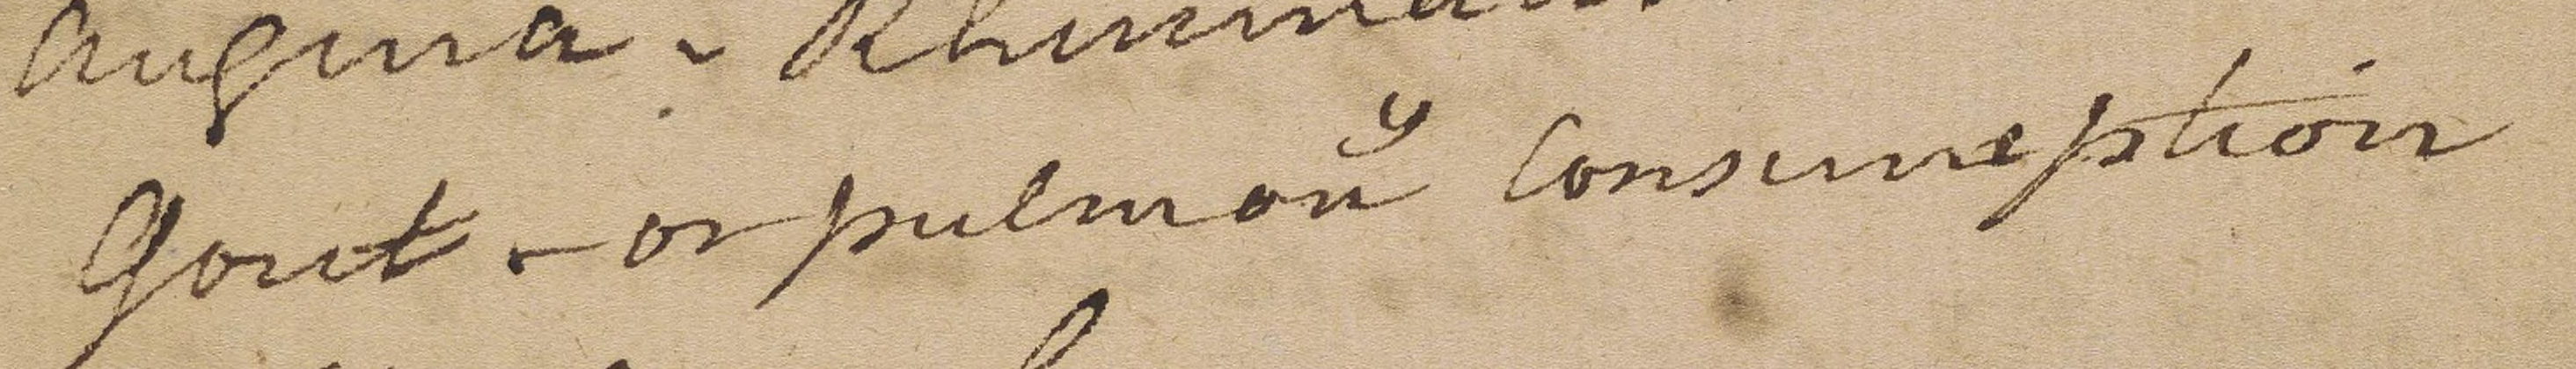gout.- or pulmon^y consumption
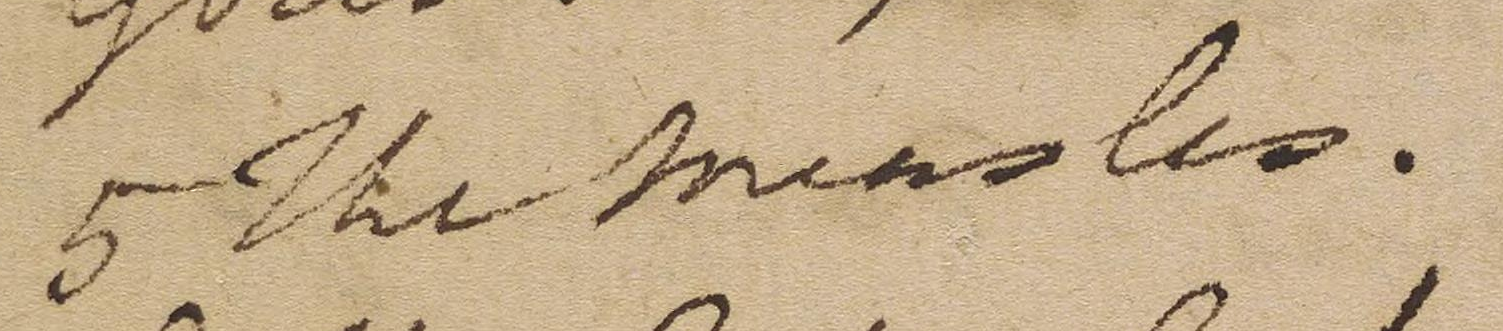5 The measles.
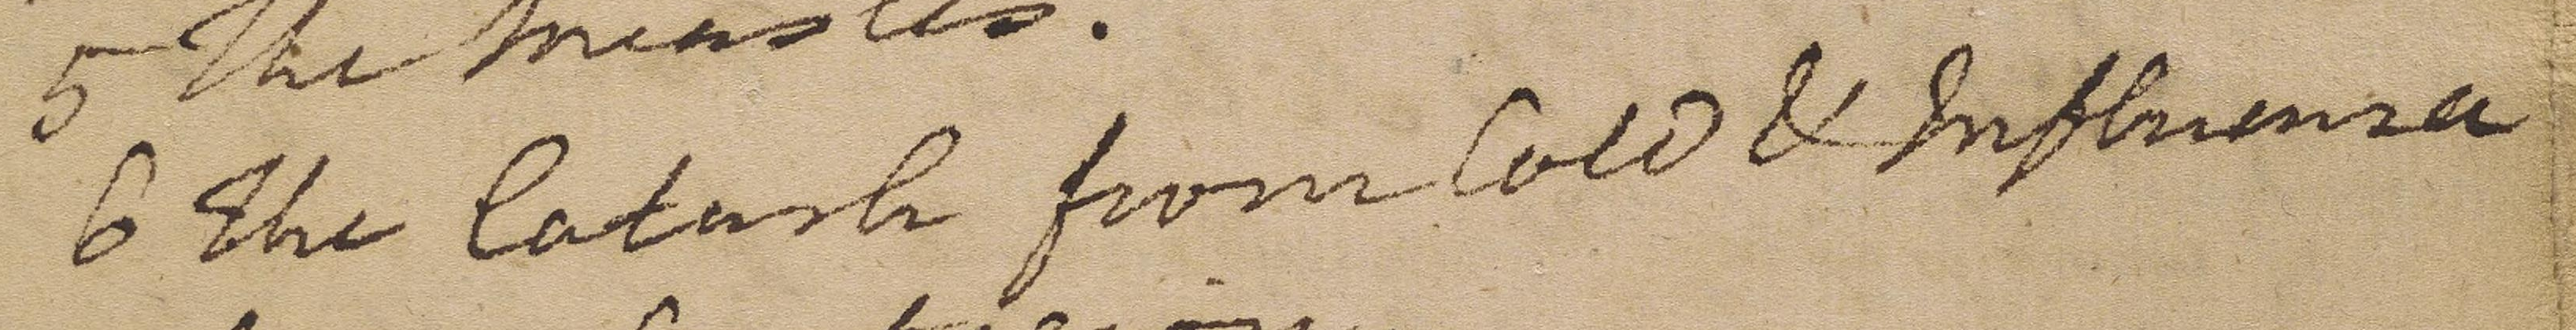6 The Catarh from Cold & Influenza
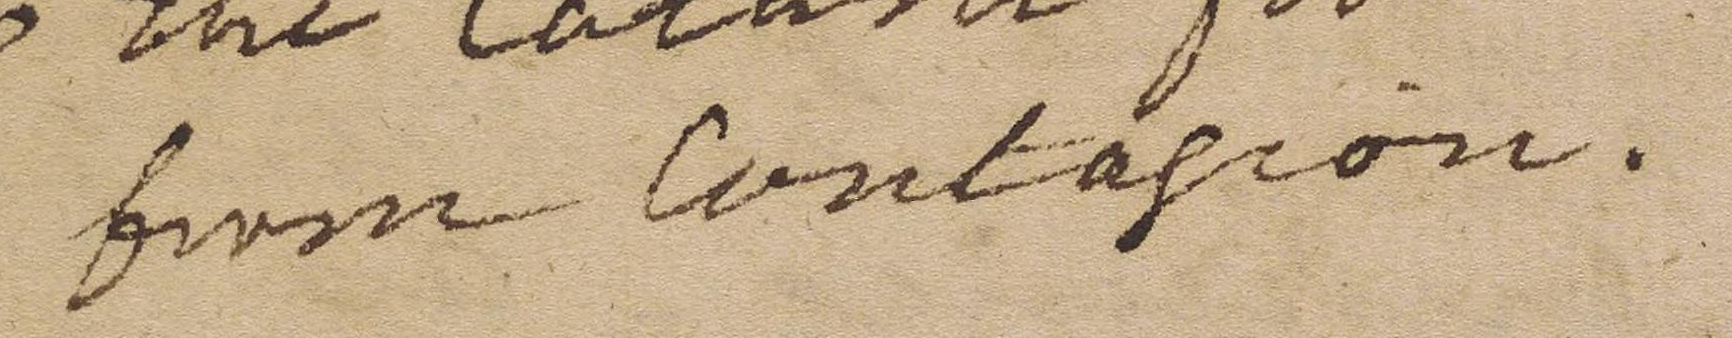from contagion.
